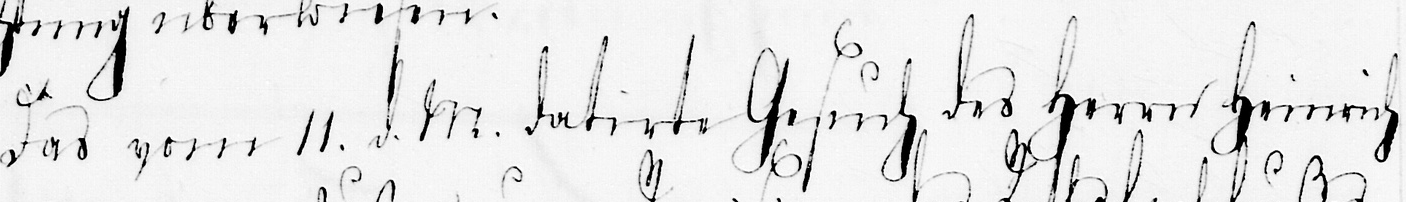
Das vom 11. d. M. datirte Gesuch des Herrn Heinrich
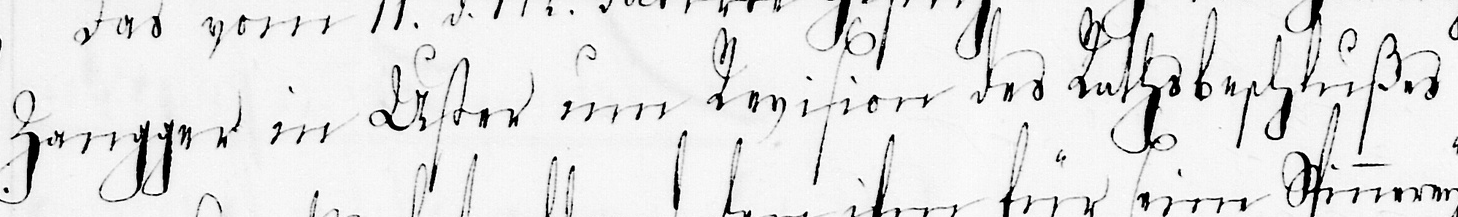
Zangger in Uster um Revision des Rathsbeschlußes
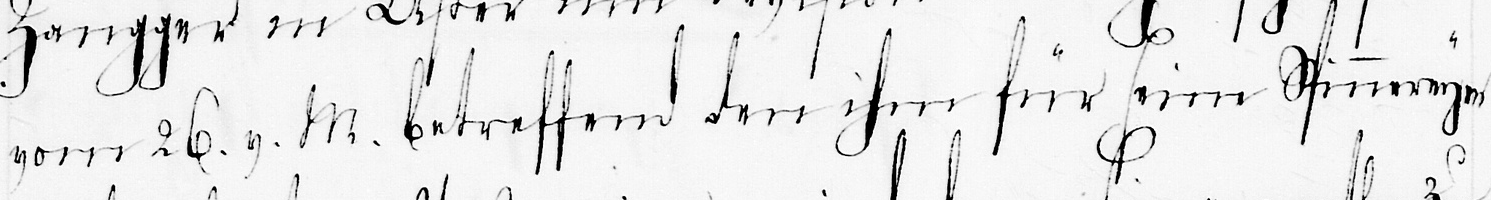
vom 26. v. M. betreffend den ihm für seine Spinnereyen
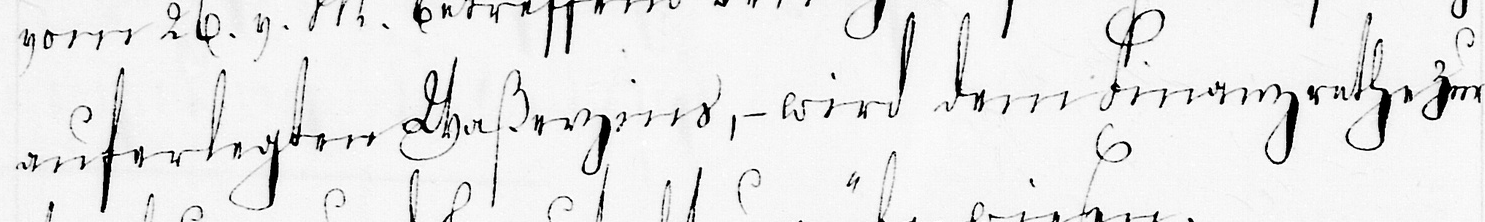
auferlegten Waßerzins, – wird dem Finanzrathe zur
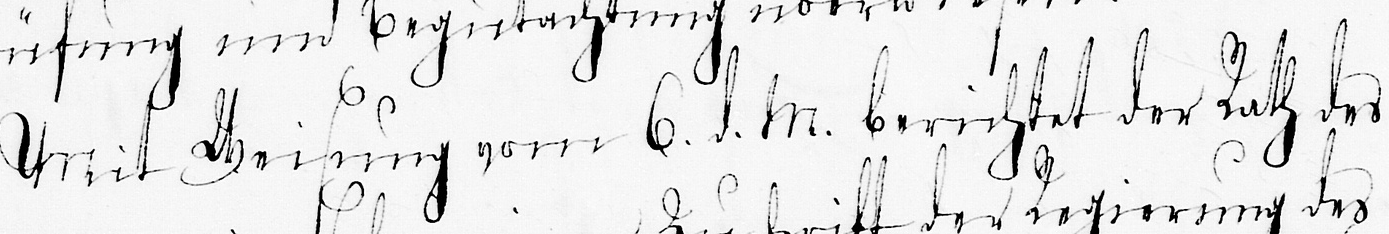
Mit Weisung vom 6. d. M. berichtet der Rath des
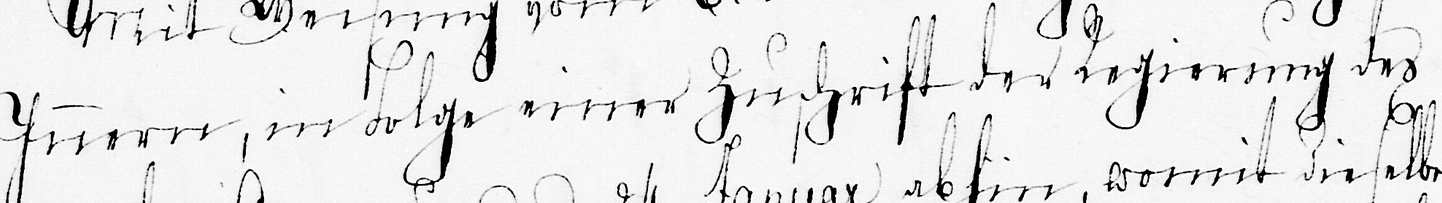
Innern, in Folge einer Zuschrift der Regierung des
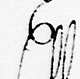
zur
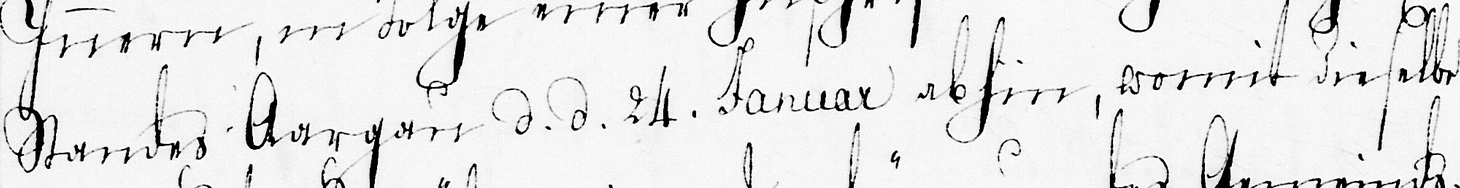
Standes Aargau d. d. 24. Januar abhin, womit dieselbe
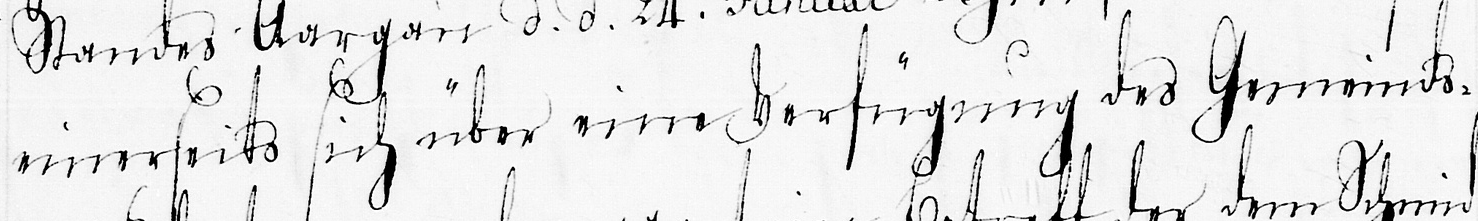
einerseits sich über eine Verfügung des Gemeinds¬
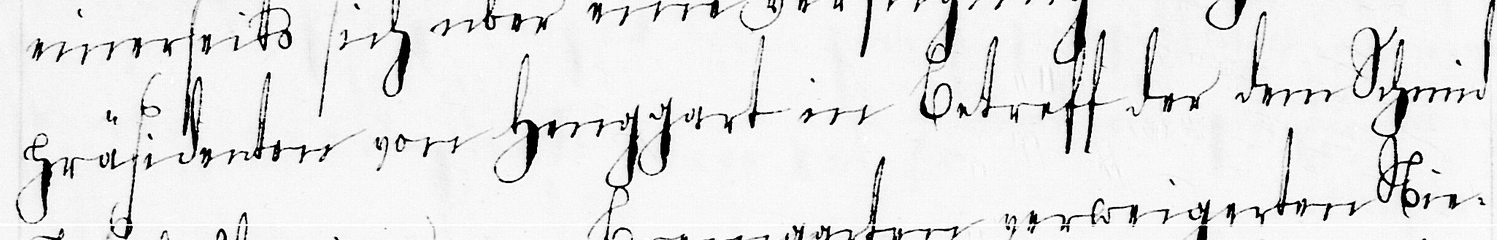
präsidenten von Henggart in Betreff der dem Schmid
